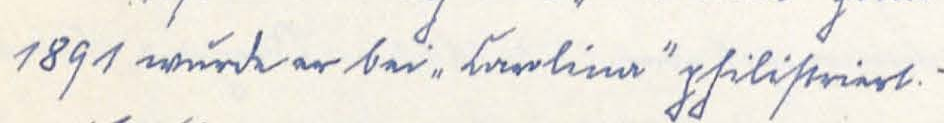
1891 wurde er an der "Carolina" philistriert.
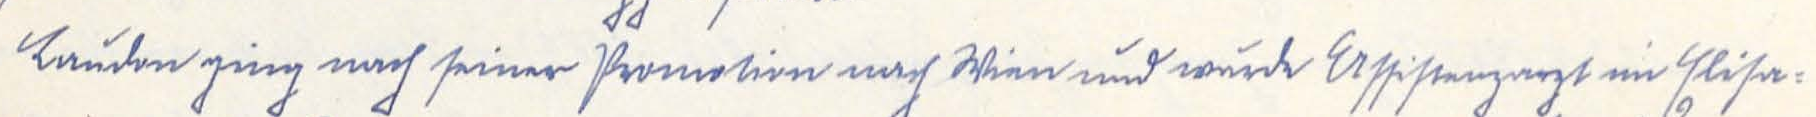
Laudon ging nach seiner Promotion nach Wien und wurde Assistenzarzt im Elisa-
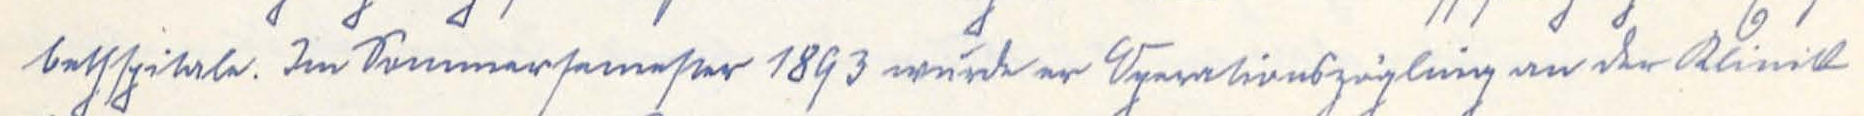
bethspitale. Im Sommersemester 1893 wurde er Operationszögling an der Klinik
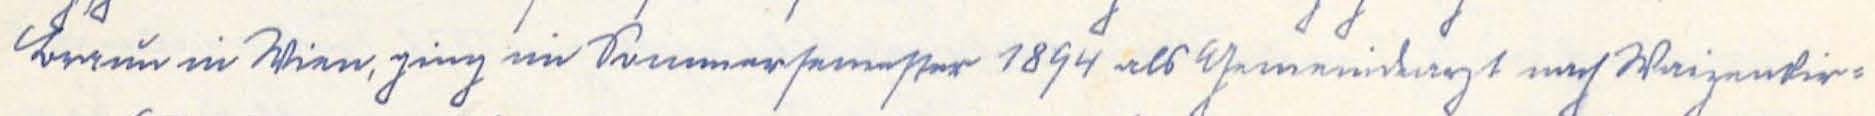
Braun in Wien, ging im Sommersemester 1894 als Gemeindearzt nach Waizenkir-
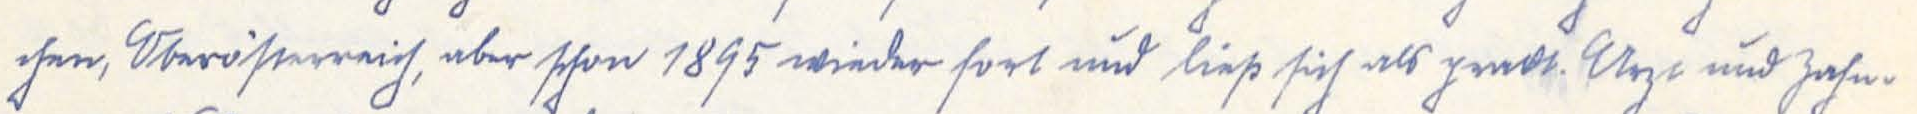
chen, Oberösterreich, aber schon 1895 wieder fort und ließ sich als prakt. Arzt und Zahn-
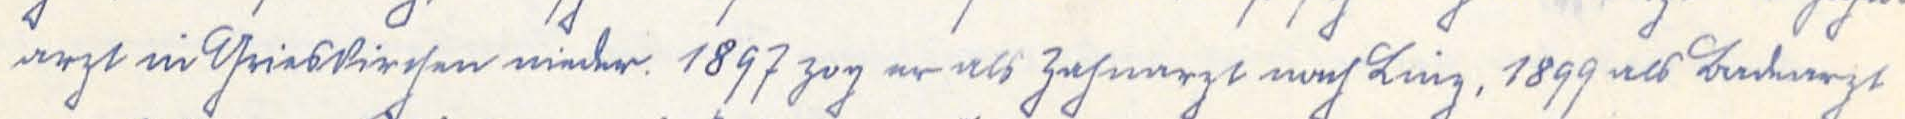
arzt in Grieskirchen nieder. 1897 zog er als Zahnarzt nach Linz, 1899 als Badearzt
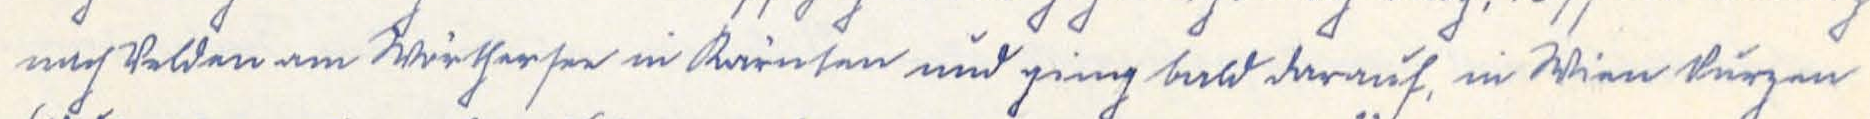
nach Velden am Wörthersee in Kärnten und ging bald darauf, in Wien kurzen
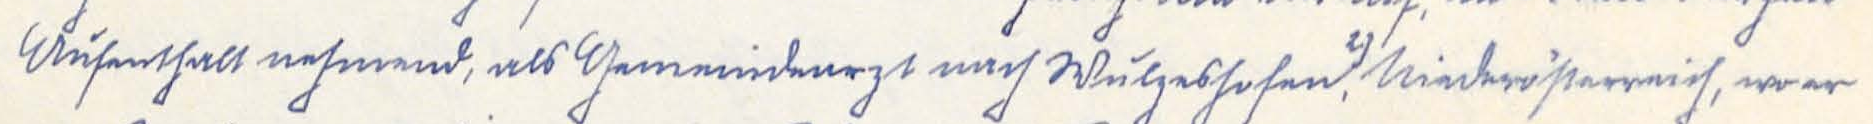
Aufenthalt nehmend , als Gemeindearzt nach Wulzeshofen 2.), Niederösterreich, wo er
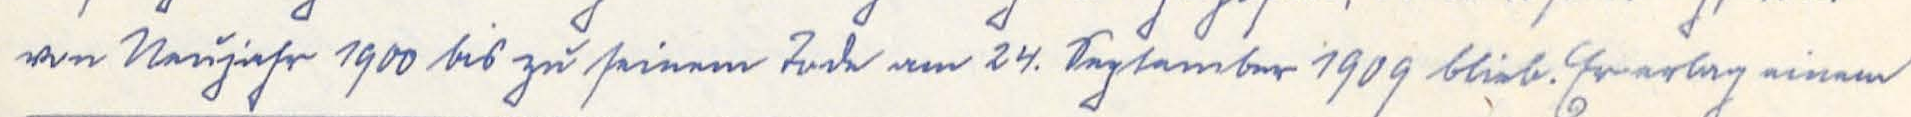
von Neujahr 1900 bis zu seinem Tode am 24. September 1909 blieb. Er erlag einem
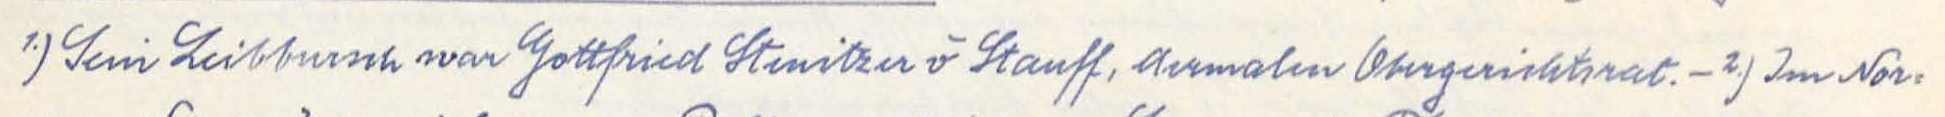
1.) Sein Leibbursch war Gottfried Stenitzer v/o Stauff, dermalen Obergerichtsrat. - 2.) Im Nor-
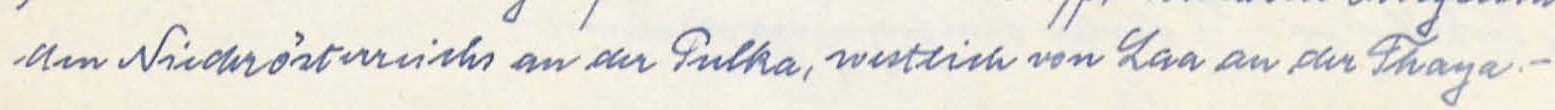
den Niederösterreichs an der Pulka, westlich von Laa an der Thaya.
